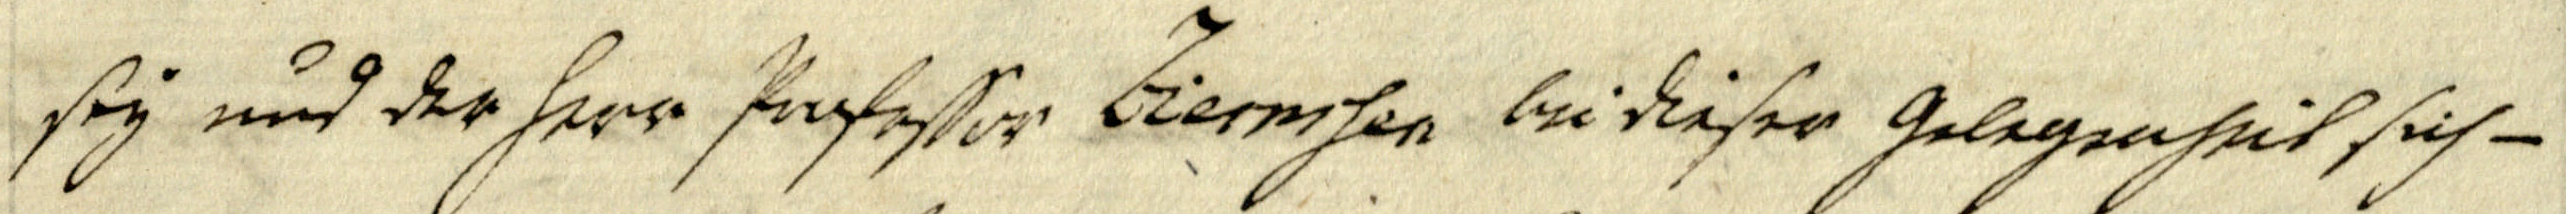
seÿ und der herr Professor Ziemssen bei dieser Gelegenheit sich
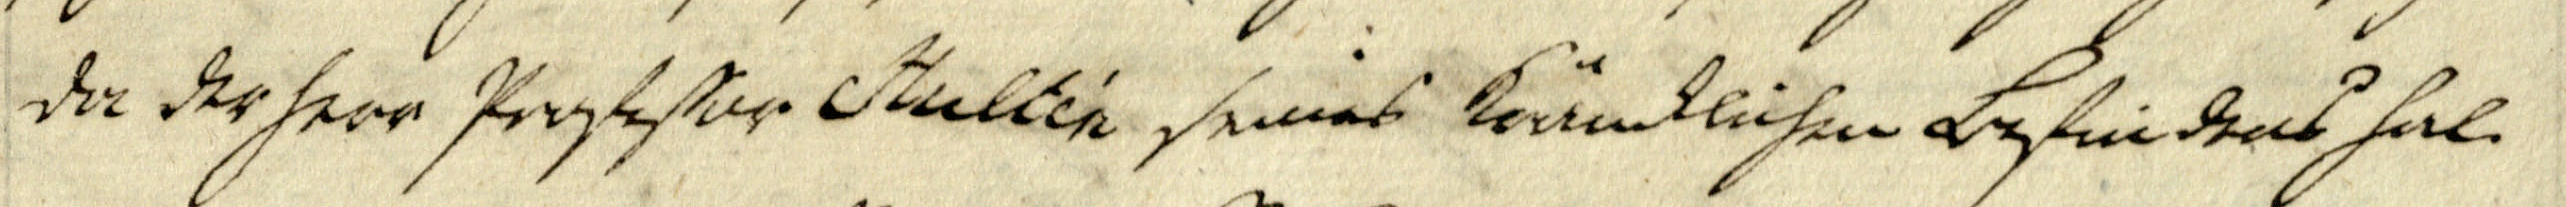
da der herr Professor Hultèn seines kräncklichen Befindens hal¬
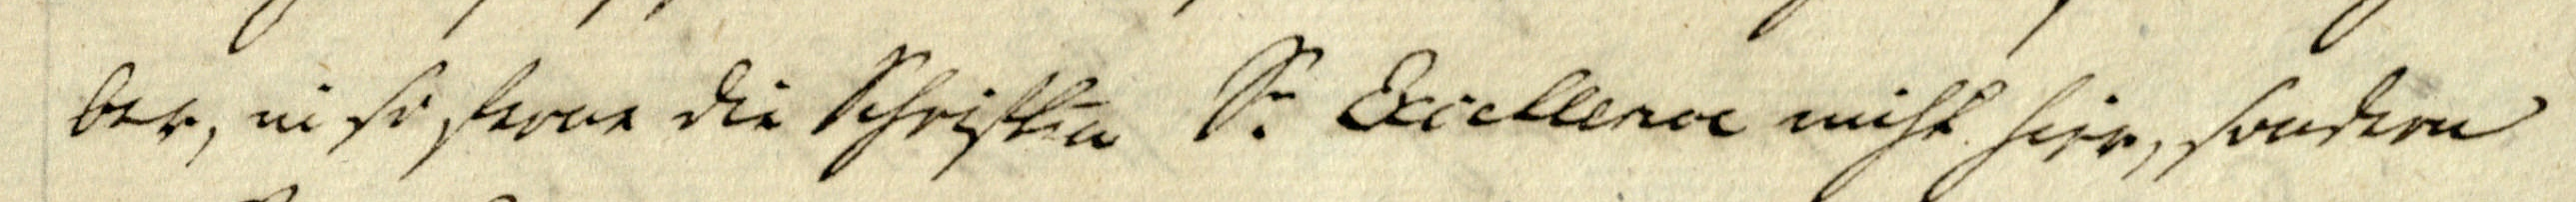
ber, in so ferne die Schriften Sr. Excellence nicht hier, sondern
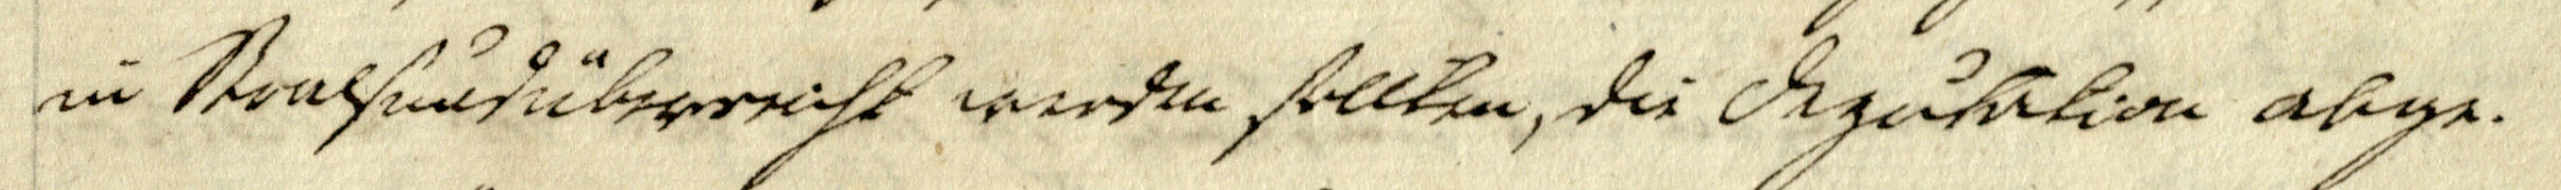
in Stralsund überreicht werden sollten, die Deputation abge¬
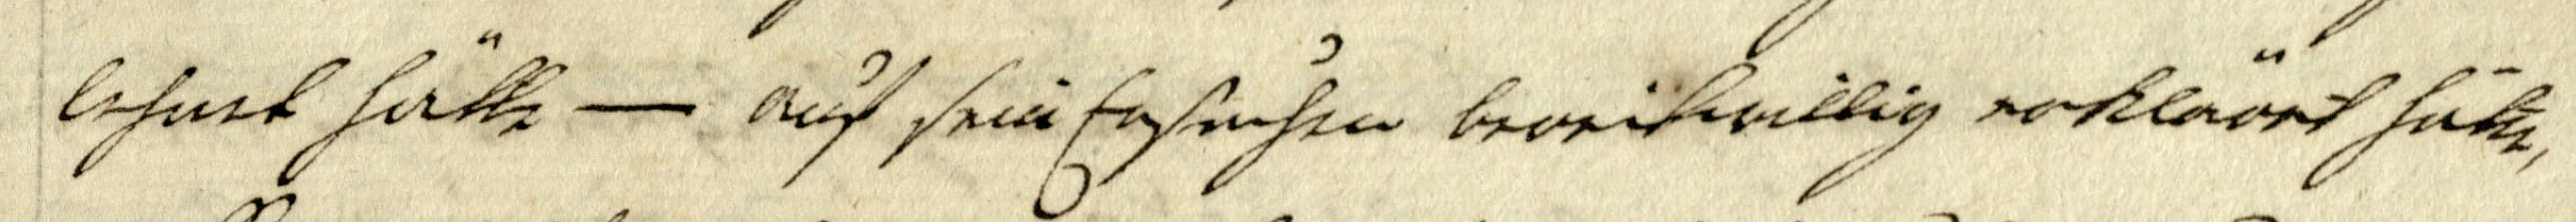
lehnt hätte auf sein Ersuchen bereitwillig erkläret hätte,
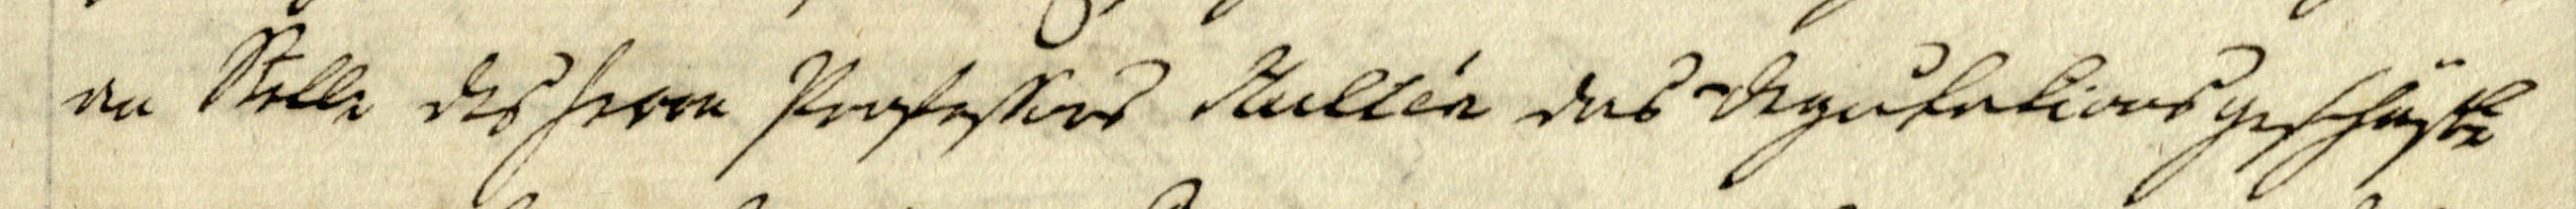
an Stelle des herrn Professors Hultèn das Deputationsgeschäfte
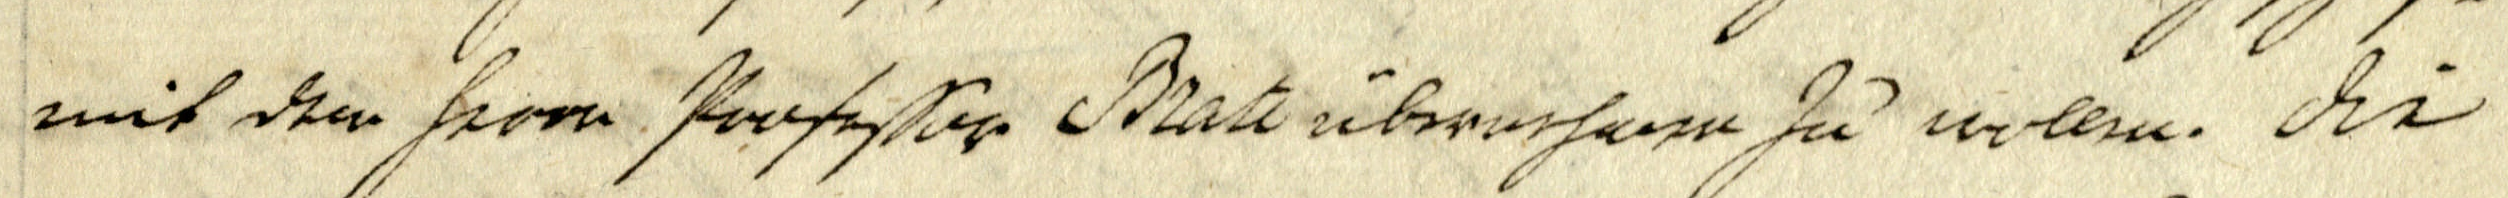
mit dem herrn Professor Bratt übernehmen zu wollen. Die
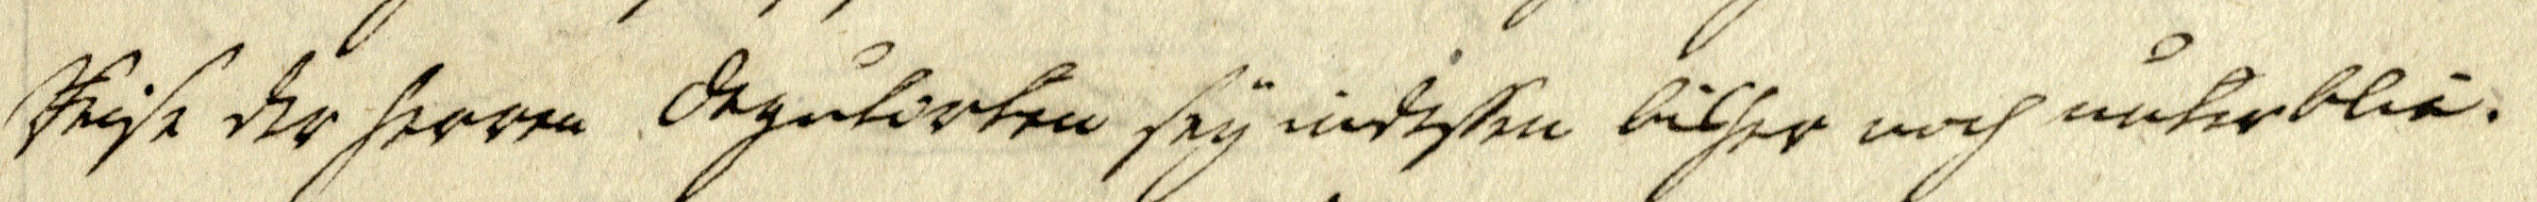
Reise der herren Deputirten seÿ indessen bisher noch unterblie¬
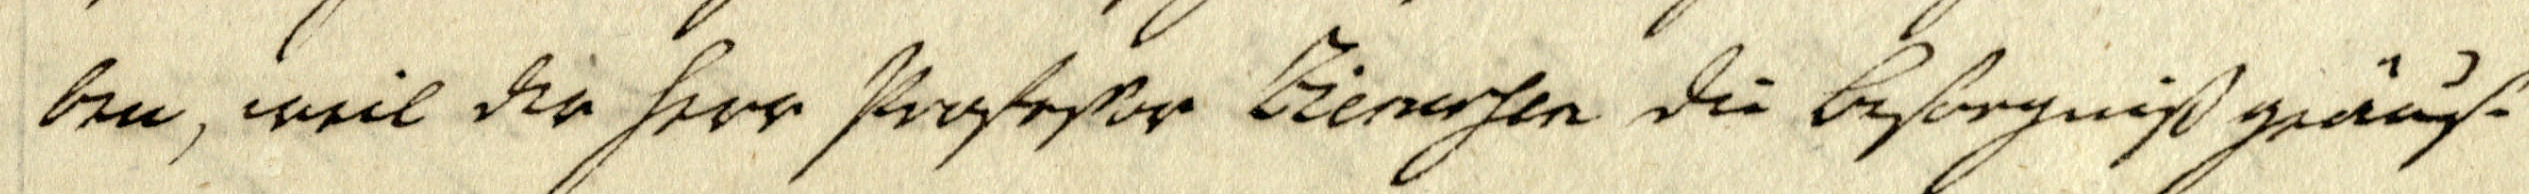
ben, weil der herr Professor Ziemssen die Besorgniß geäus¬
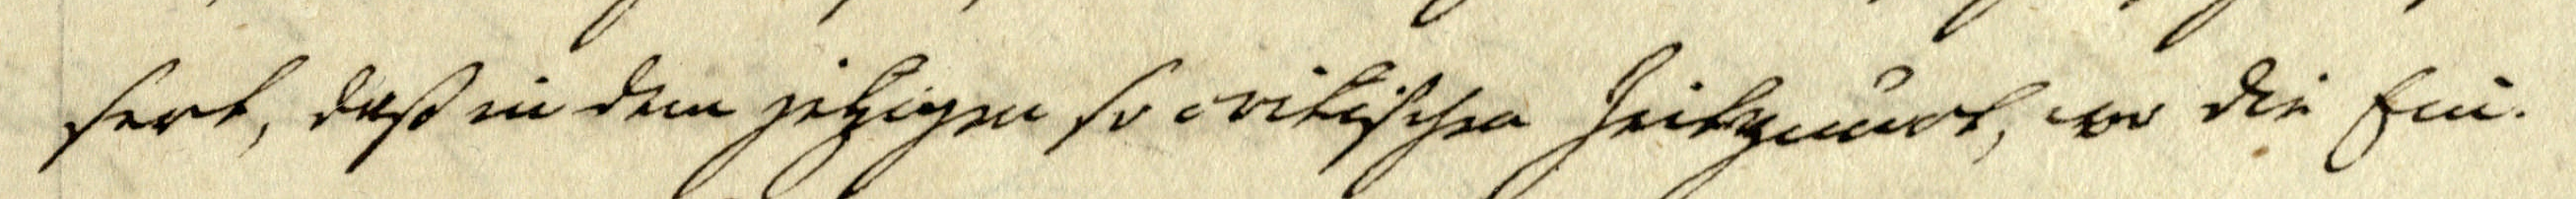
sert, daß in dem jetzigen so critischen Zeitpunct, wo die Ein¬
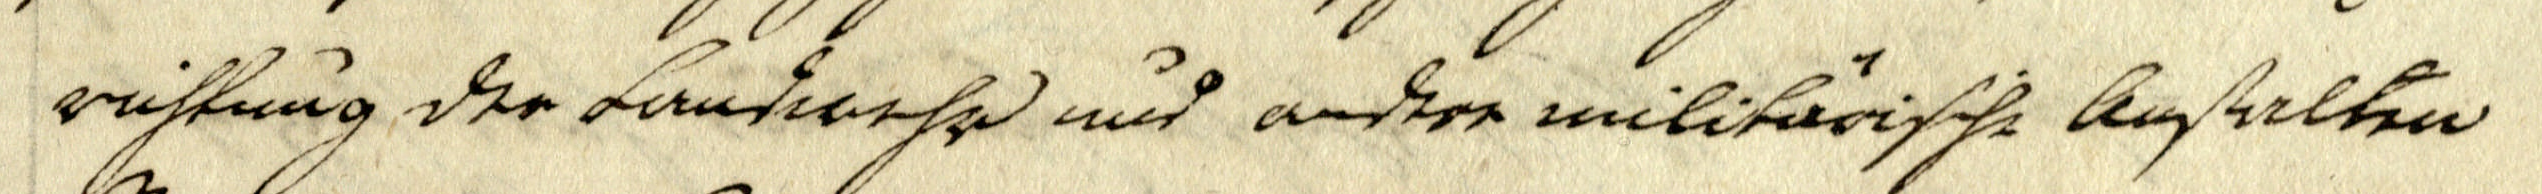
richtung der Landwehr und andere militärische Anstalten
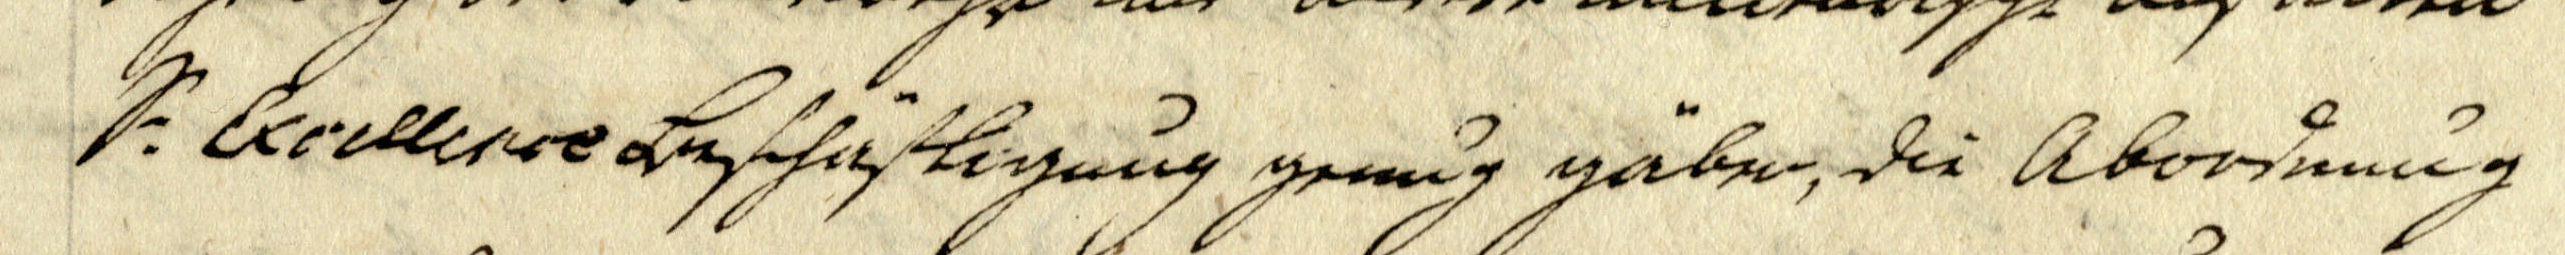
Sr. Excellence Beschäftigung genug gäben, die Abordnung
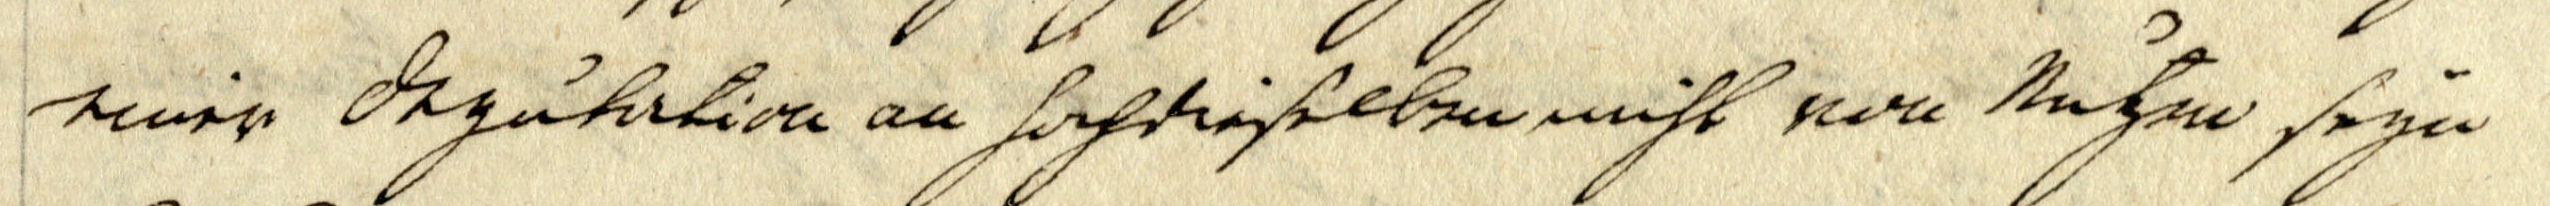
einer Deputation an hochdieselben nicht von Nutzen seÿn
